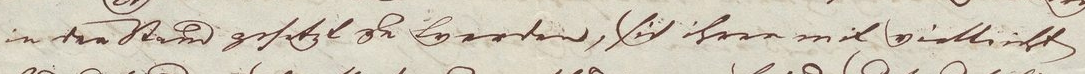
in den Stand gesetzt zu werden, sich ihrer mit vielleicht
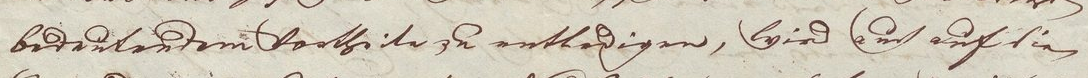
bedeutendem Vortheile zu entledigen, wird auch auf die
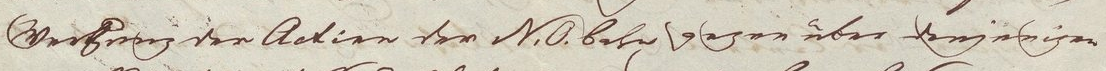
Werthung der Actien der N.O.bahn gegen über denjenigen
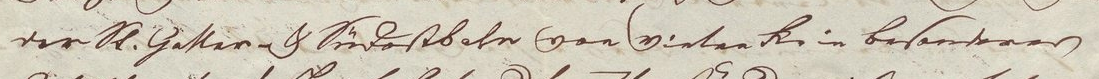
der St.Galler- & Südostbahn von vielen kein besonderes
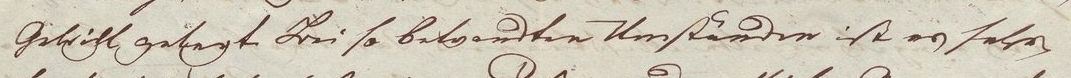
Gewicht gelegt. Bei so bewandten Umständen ist es sehr
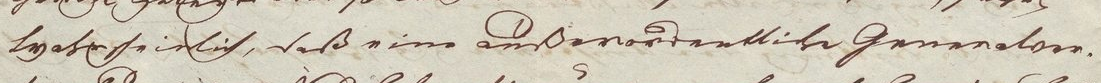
wahrscheinlich, daß eine außerordentliche Generalver-
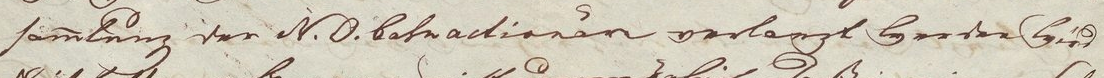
sammlung der N.O.bahnactionäre verlangt werden wird
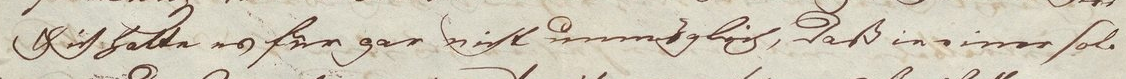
& ich halte es für gar nicht unmöglich, daß in einer sol-
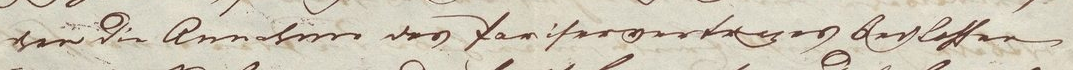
chen die Annahme des Pariservertrages beschlossen
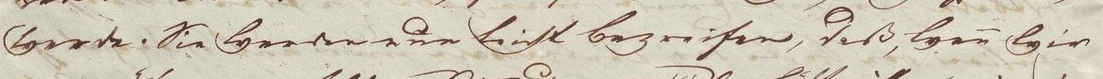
werde. Sie werden nun leicht begreifen, daß, wenn wir
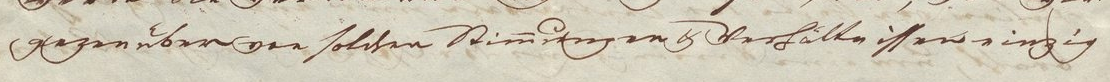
gegen über von solchen Stimmungen & Verhältnissen einzig
